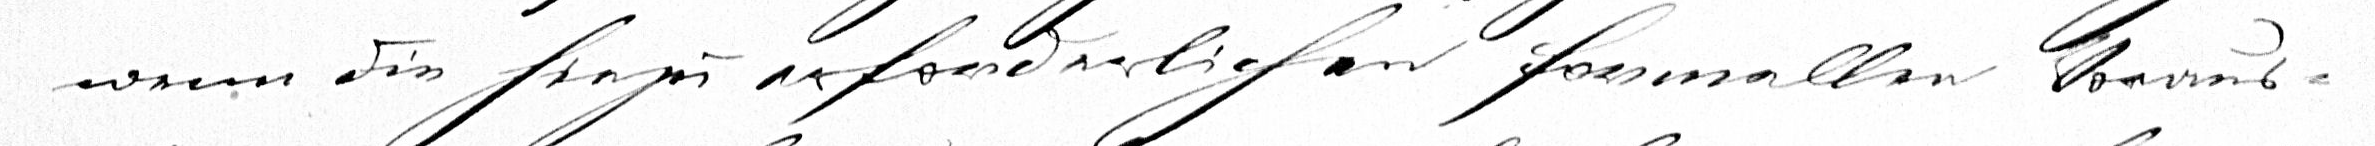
wenn die hiezu erforderlichen formellen Voraus¬
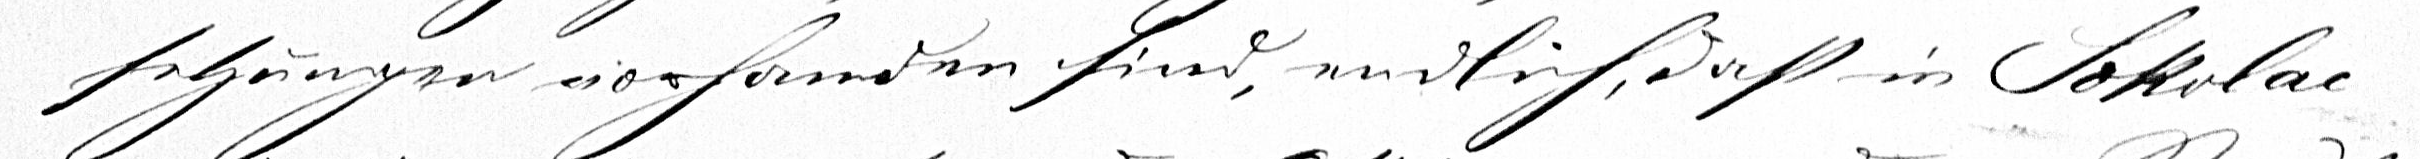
setzungen vorhanden sind, endlich, daß in Sokolac
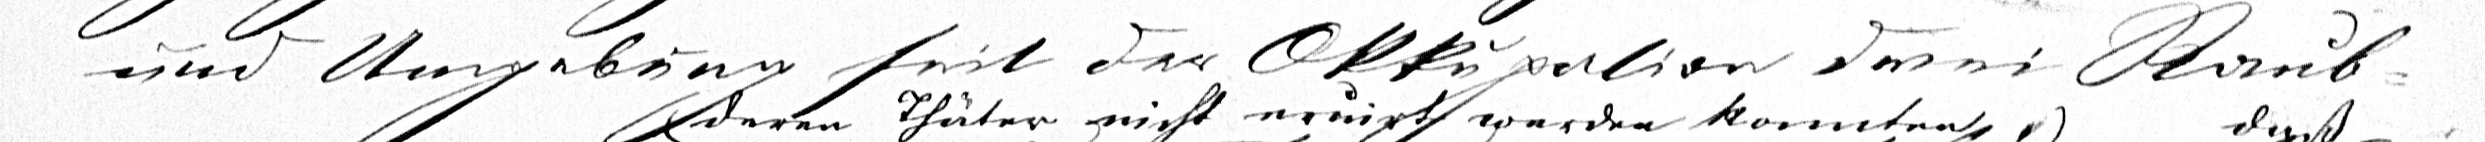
und Umgebung seit der Okkupation drei Raub¬
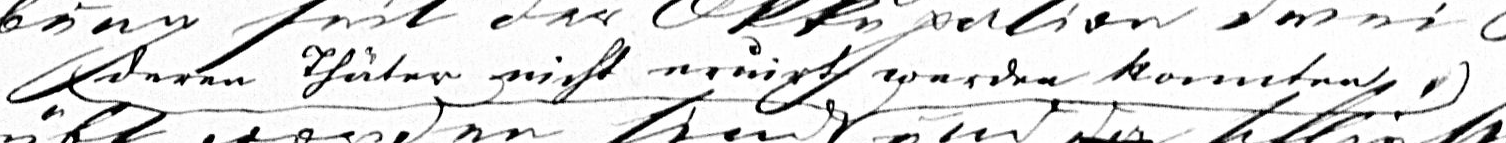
deren Thäter nicht eruirt werden konnten
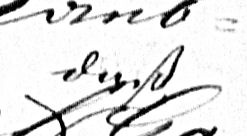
daß
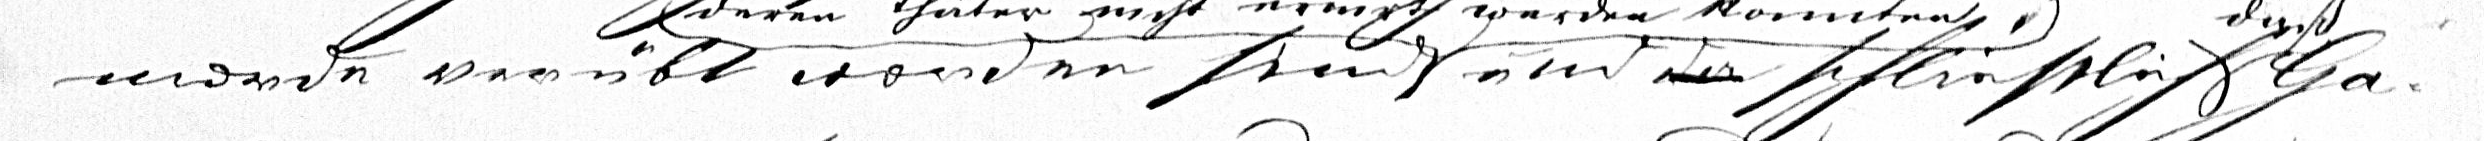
morde verübt von den und schließlich Ga¬
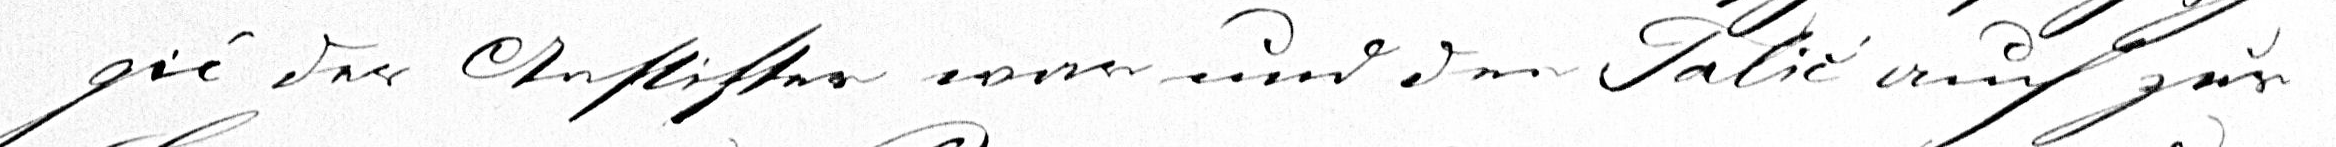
gić der Anstifter war und den Talić auch zur
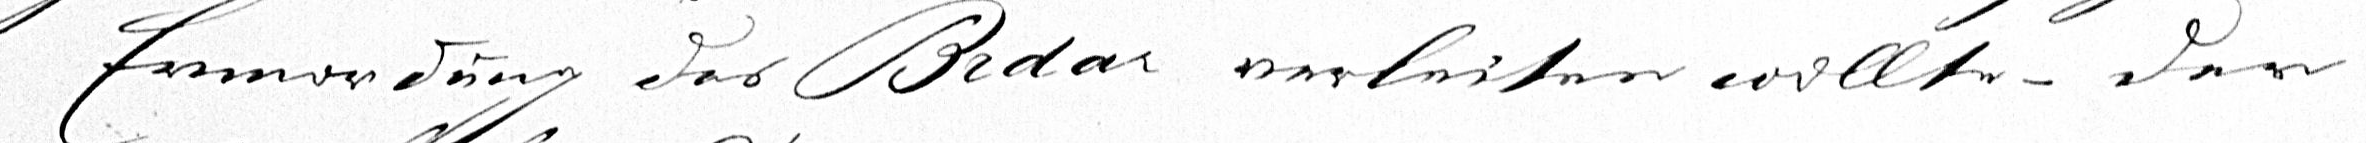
Ermordung des Brdar verleiten wollte-der
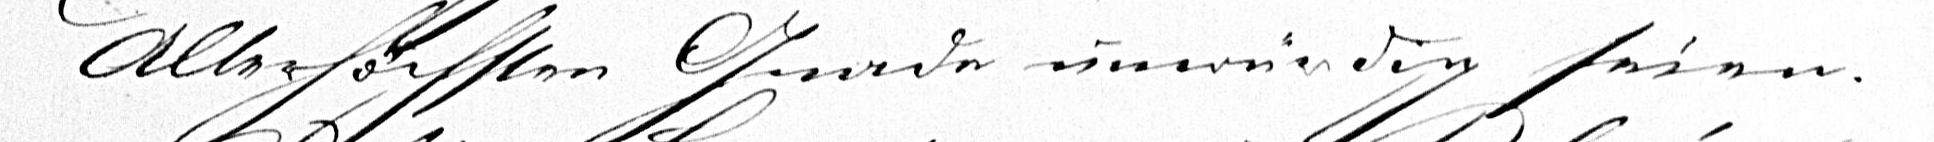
Allerhöchsten Gnade unwürdig seien.
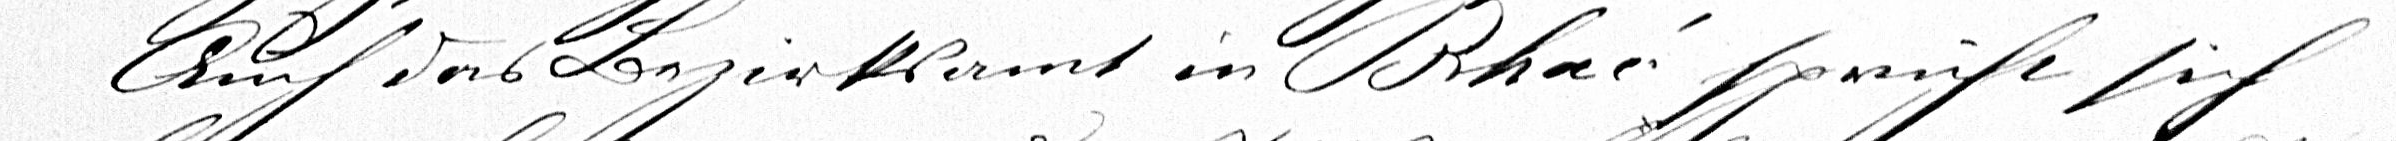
Auch das Bezirksamt in Bhać spricht sich
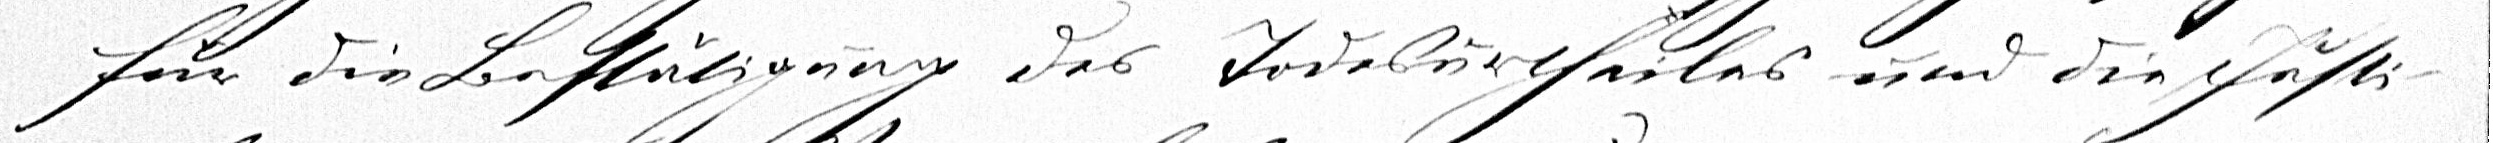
für die Bestätigung des Todesurtheiles und die Justi¬
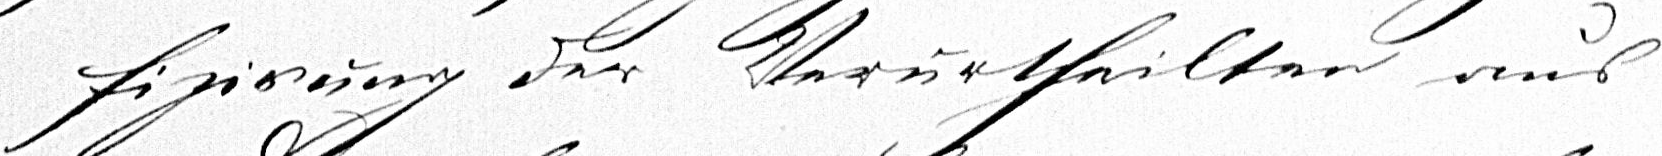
fizirung der Verutheilten aus
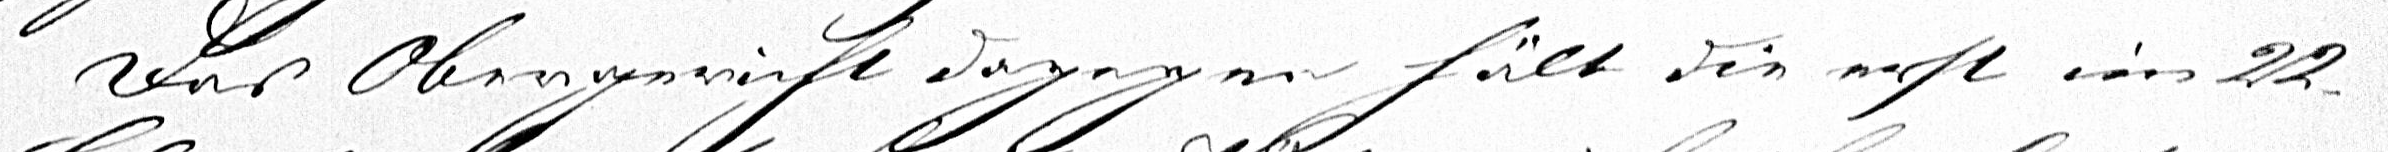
Das Obergericht dagegen hält die erst im 22
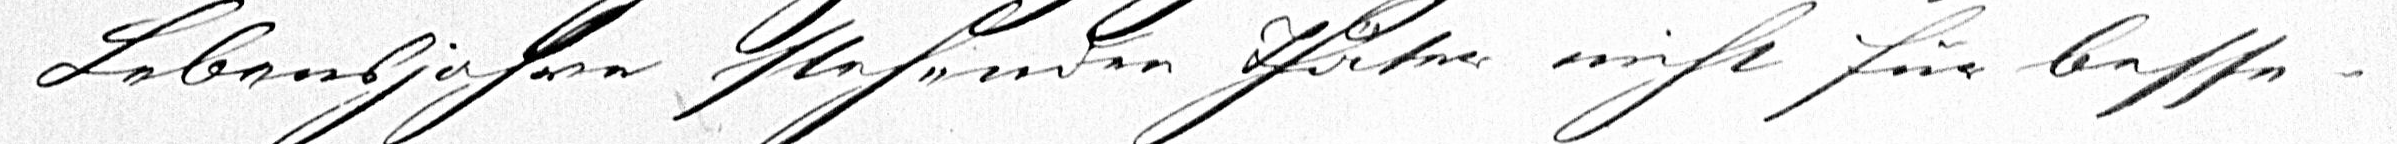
Lebensjahre stehenden Thäter nicht für besse-
